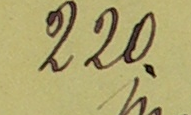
220
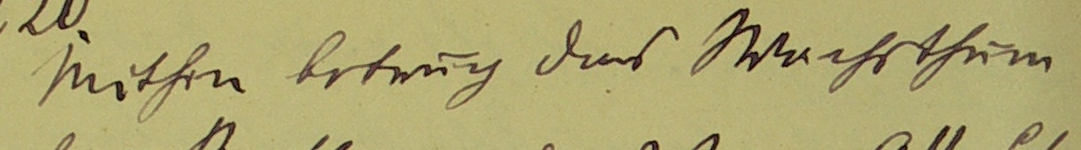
Mithin betrug das Wachstum
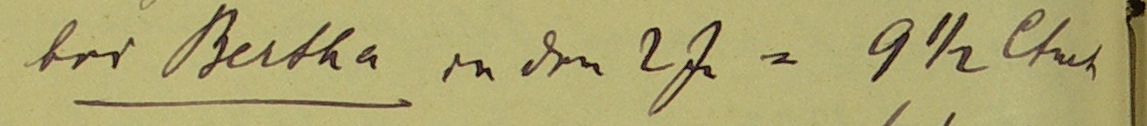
bei Bertha in den 2 Jahren = 9 ½ ctmtr
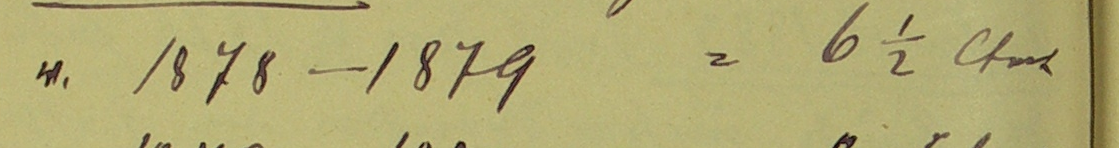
Von 1878- 1879 = 6 ½ ctmtr
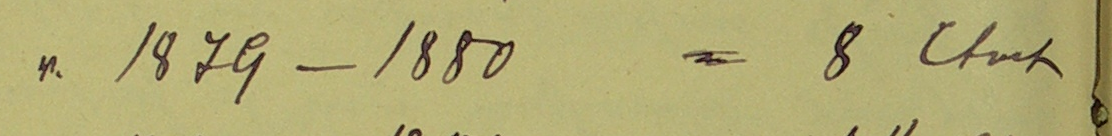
1879-1880 = 8 ctmtr
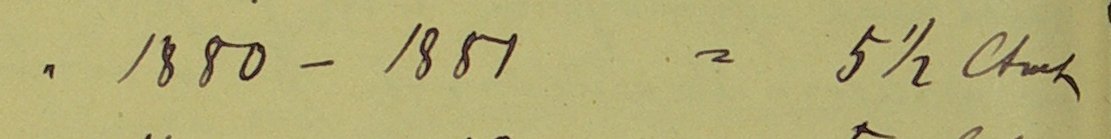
1880-1881 = 5, ½ ctmtr
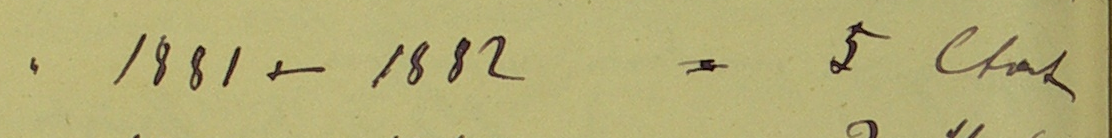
1881-1882 = 5 ctmtr
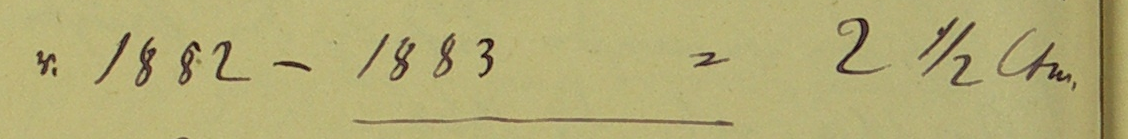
1882-1883 = 2 ½ ctmtr
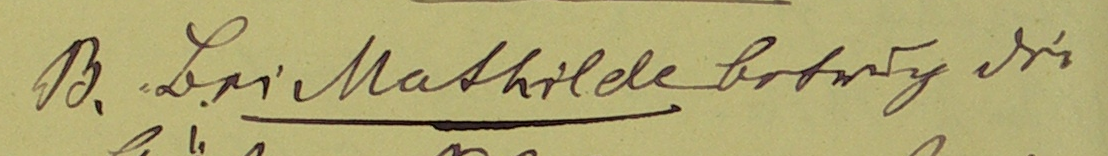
B). Bei Mathilde betrug die
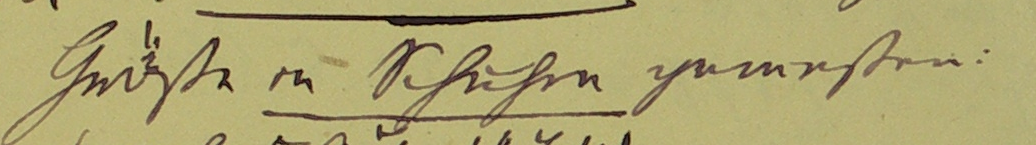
Größe in Schuhen gemeßen
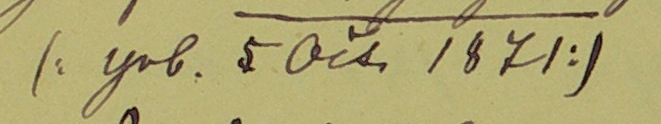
( geb. 5. Okt. 18 )
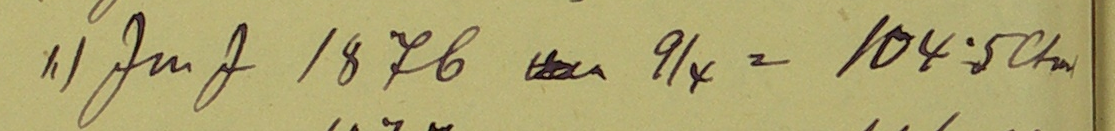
1) Im Jahre 1876 9/4 = 104,5 ctmtr
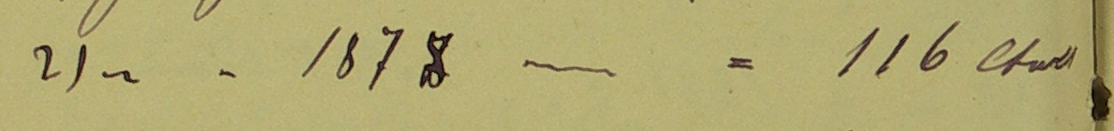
2) 1878 = 116 ctmtr
